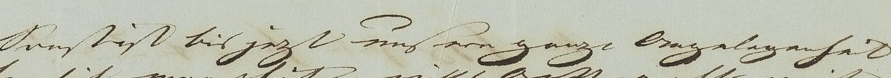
Sonst ist bis jezt unsere ganze Angelegenheit
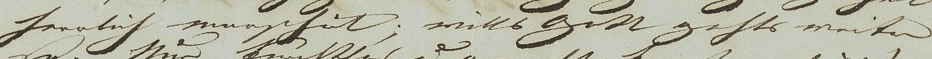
herrlich marschirt; wills Gott gehts weiter
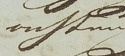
achtung
